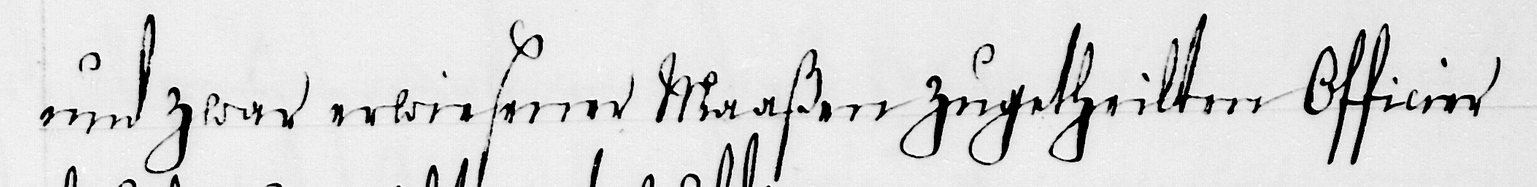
und zwar erwiesener Maaßen zugetheilten Officier
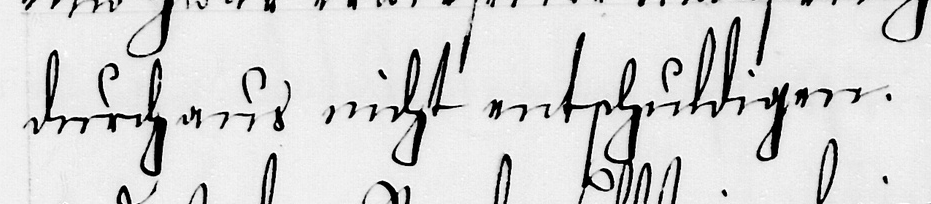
durchaus nicht entschuldigen.
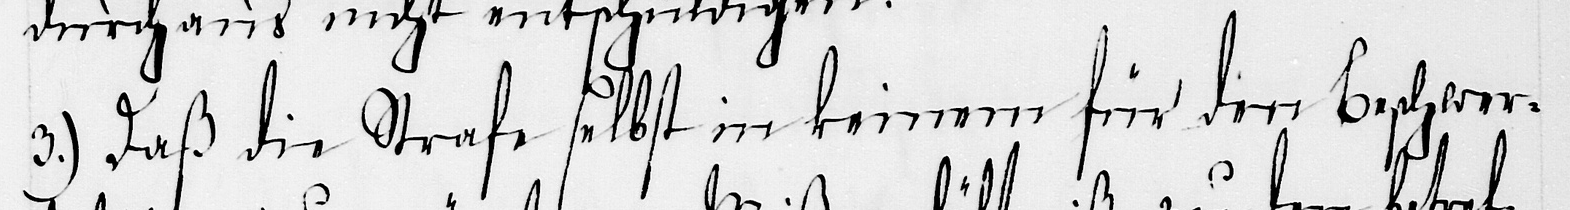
3.) Daß die Strafe selbst in keinem für den Beschwer¬
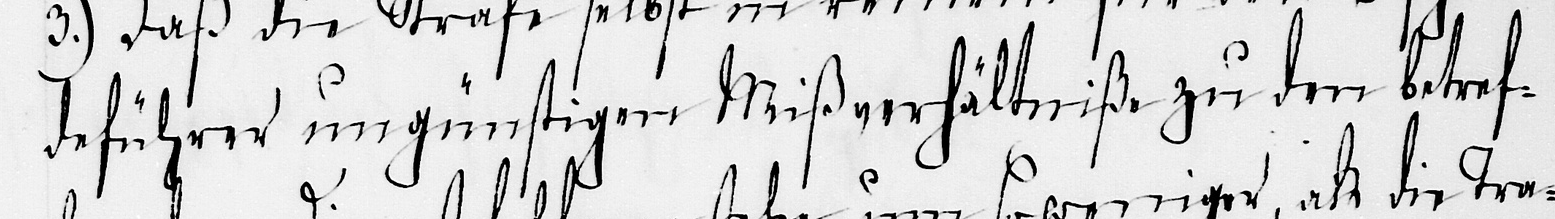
deführer ungünstigen Mißverhältniße zu den betref¬
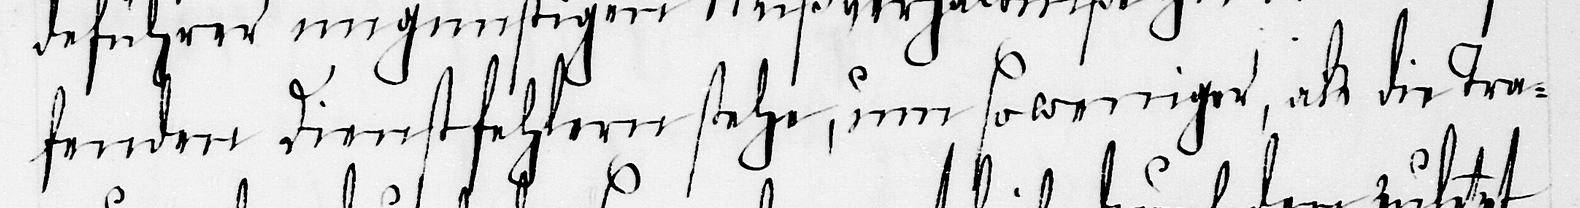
fenden Dienstfehlern stehe, um so weniger, als die Tra¬
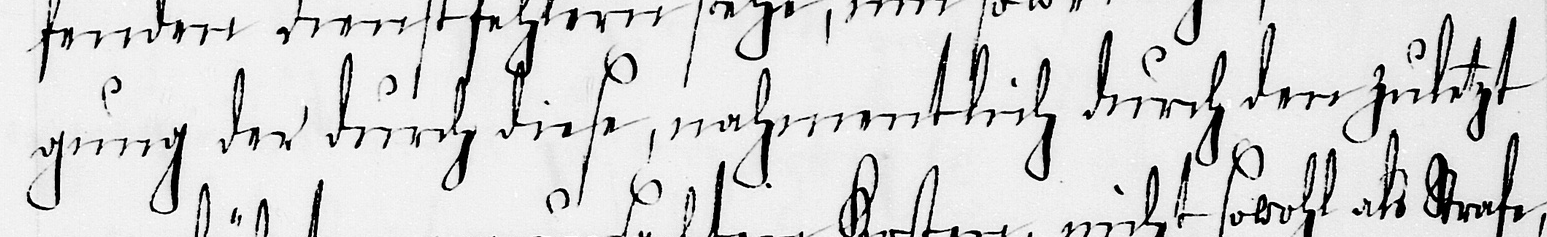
gung der durch diese, nahmentlich durch den zuletzt
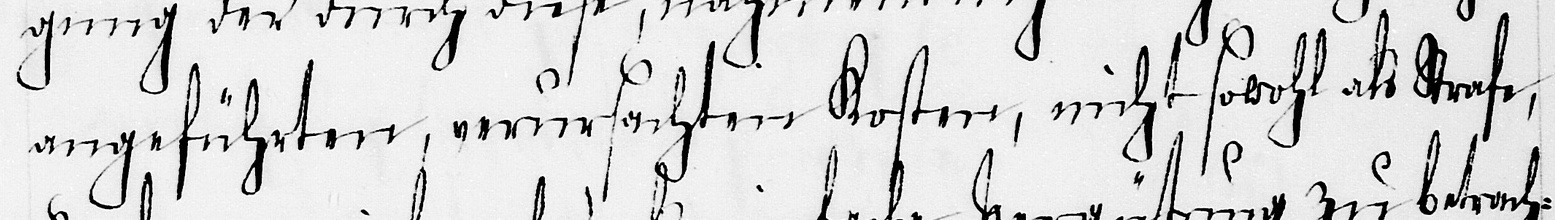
angeführten, verursachten Kosten, nicht sowohl als Straf¬
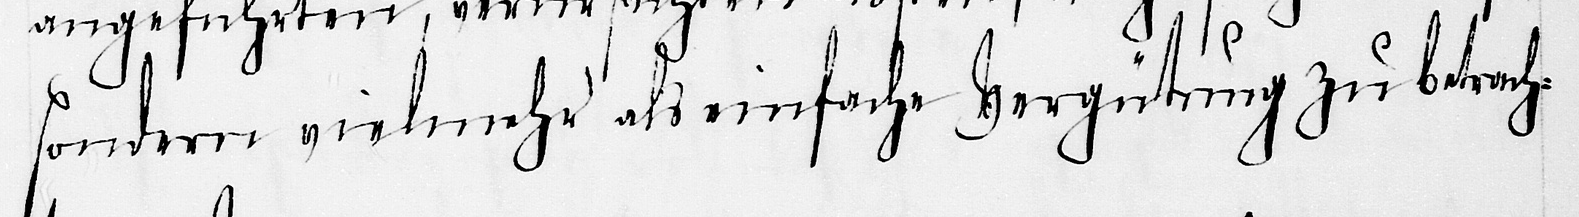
sondern vielmehr als einfache Vergütung zu betrach¬
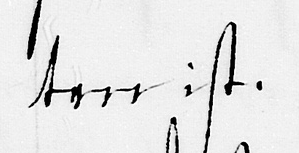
ten ist.
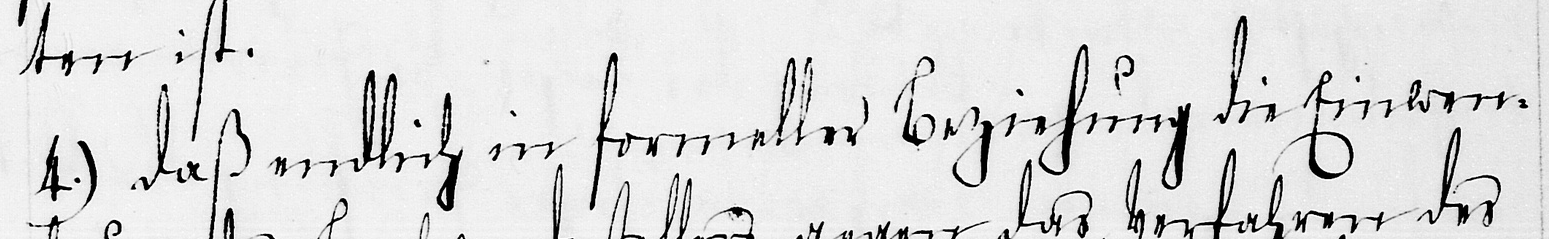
4.) daß endlich in formeller Beziehung die Einwen¬
